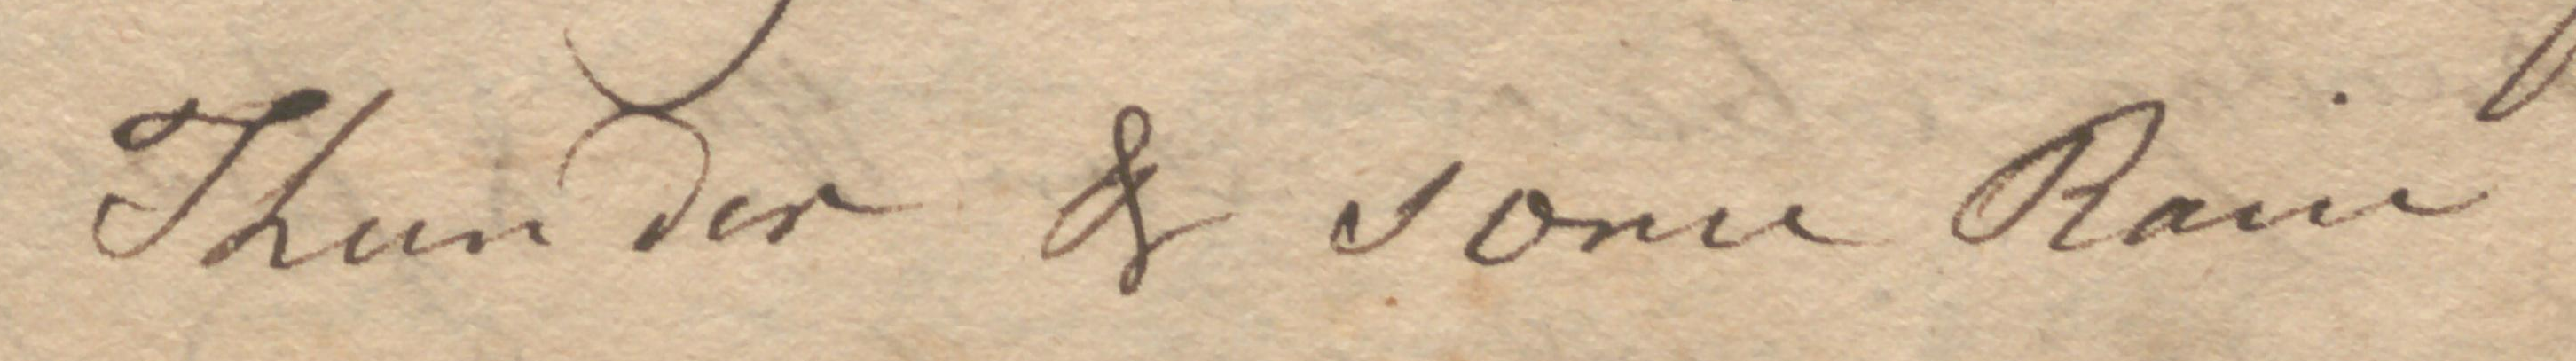Thunder & some Rain
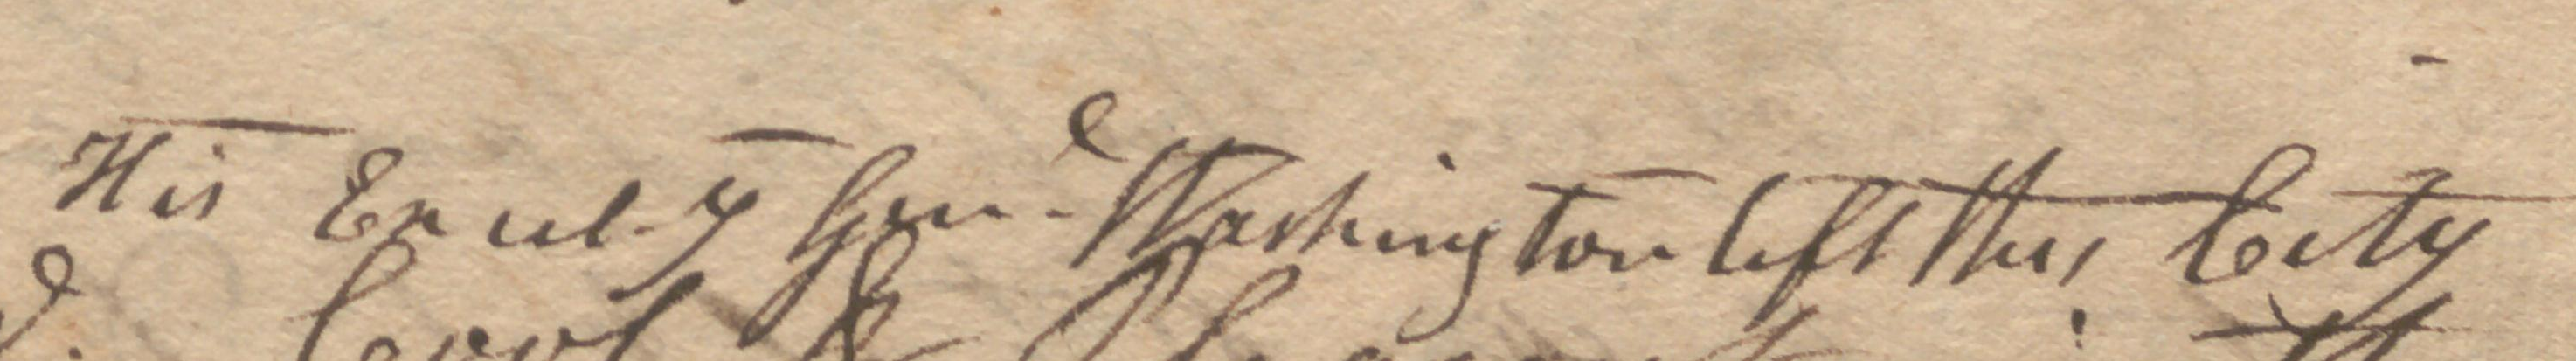His Excel^y. Gen^l. Washington left this City
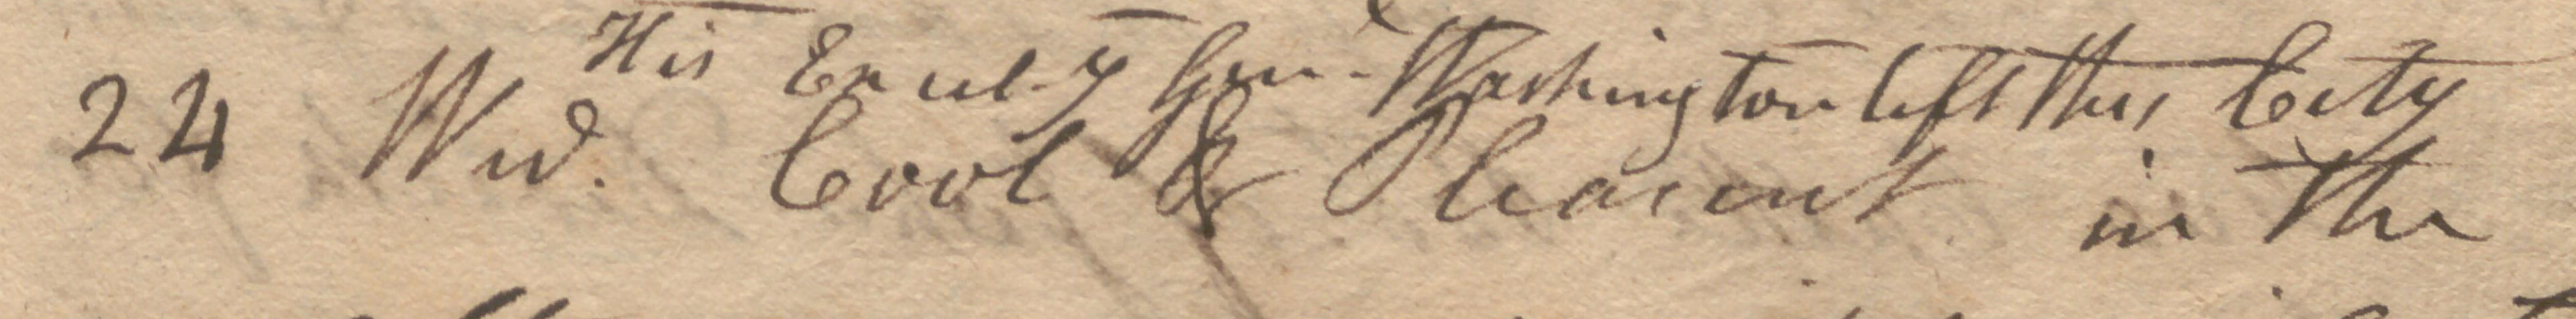24 Wed. Cool & Pleasent in the
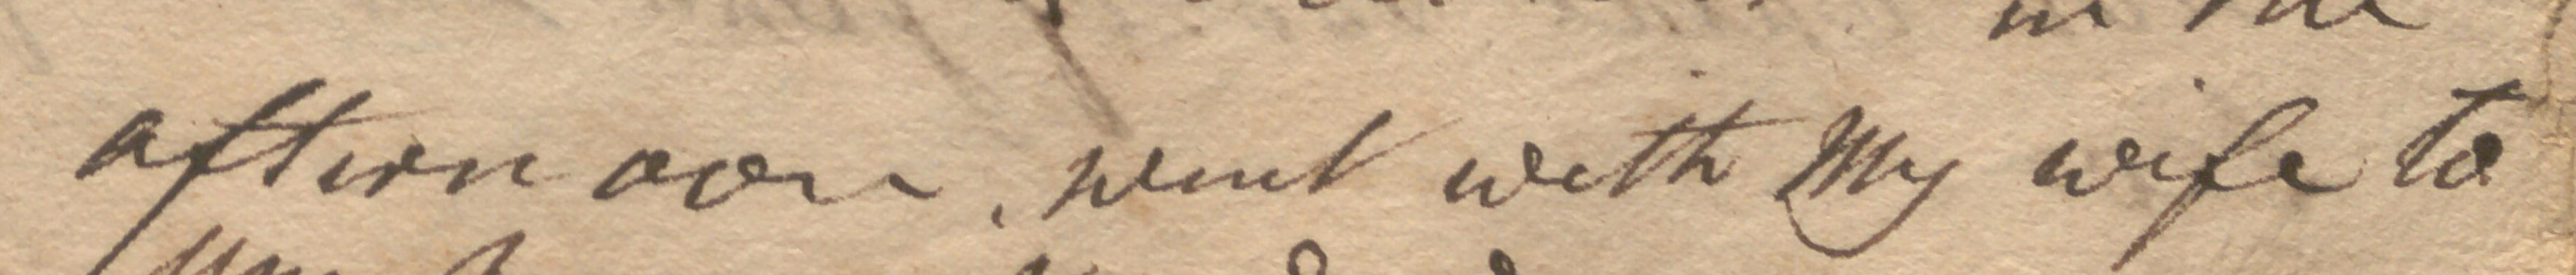afternoon. went with My wife to
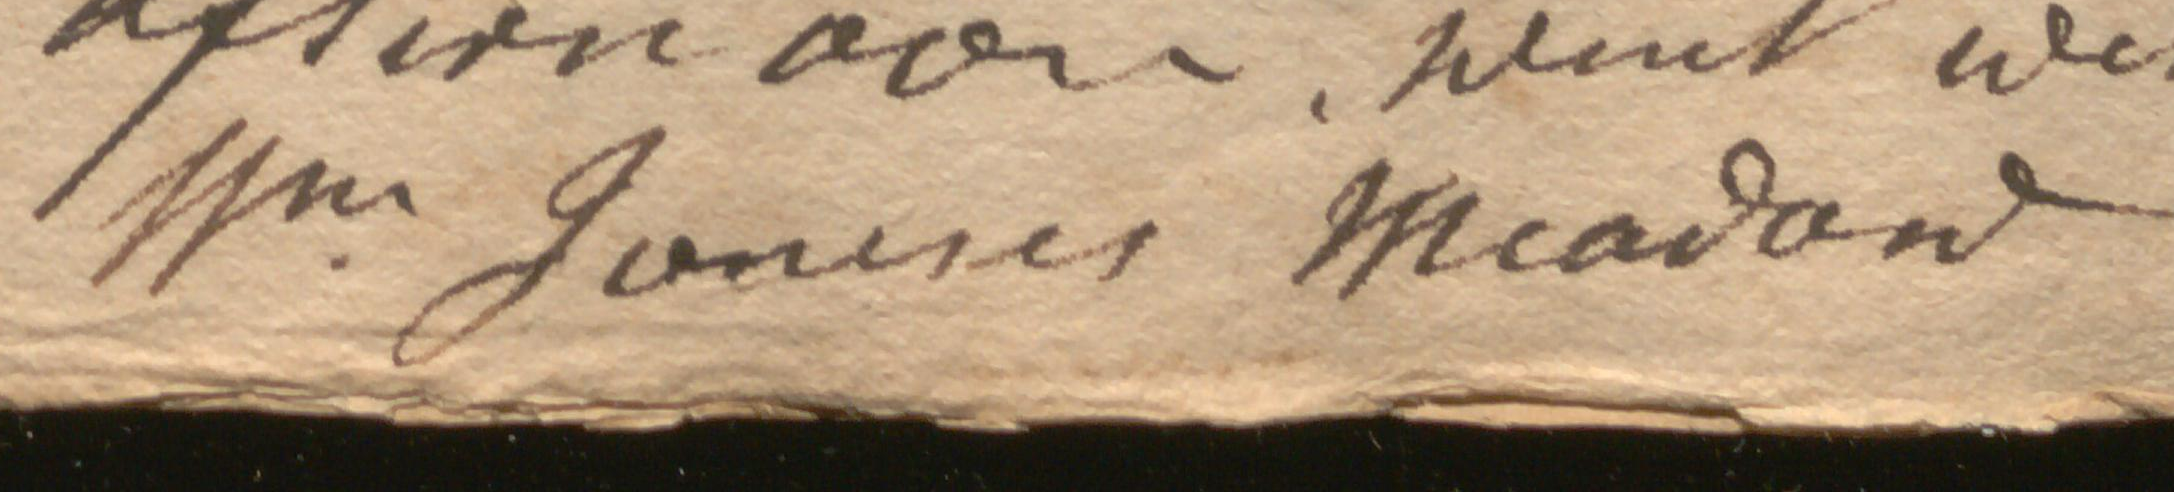M^r. Joneses Meadow
